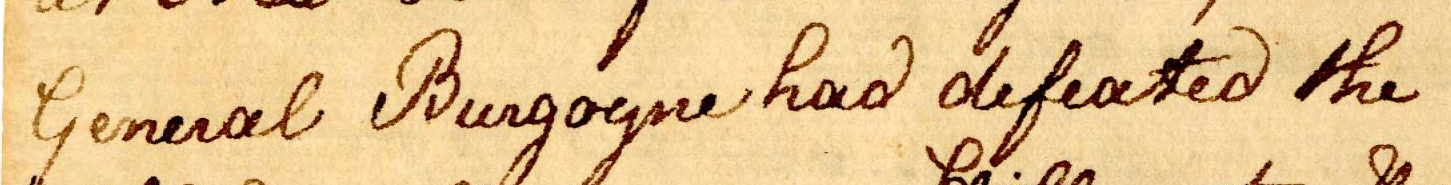General Burgoyne had defeated the
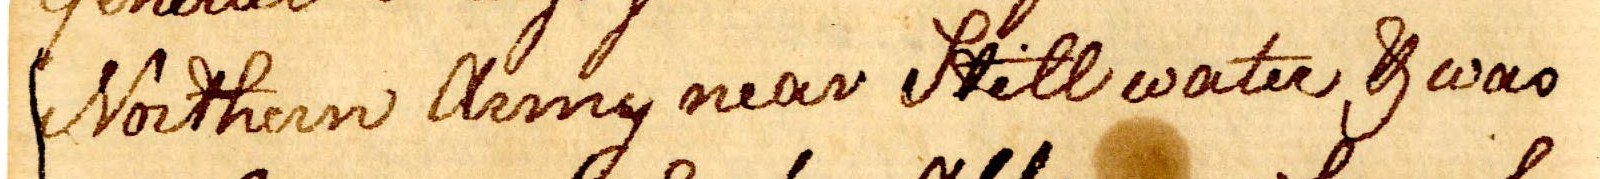Northern Army near Still water & was
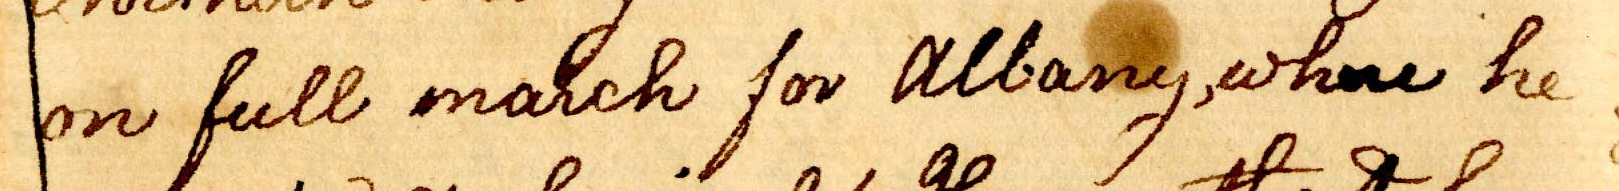on full march for Albany, where he
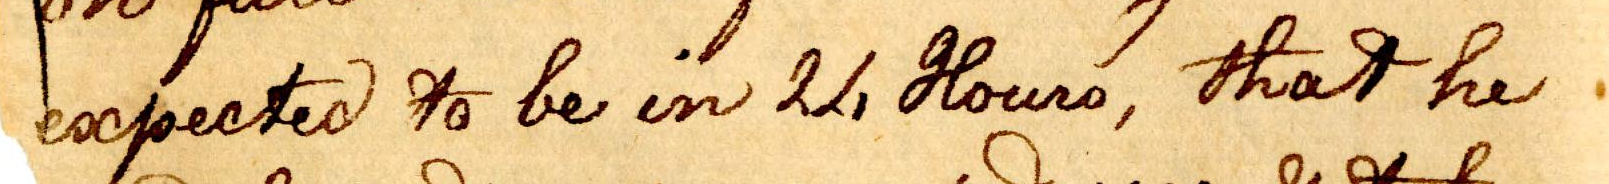expected to be in 24 Hours, that he
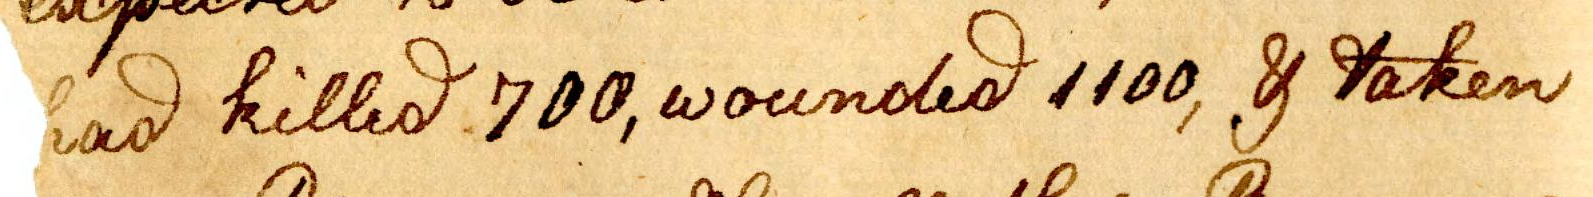head killed 700, wounded 1100, & taken
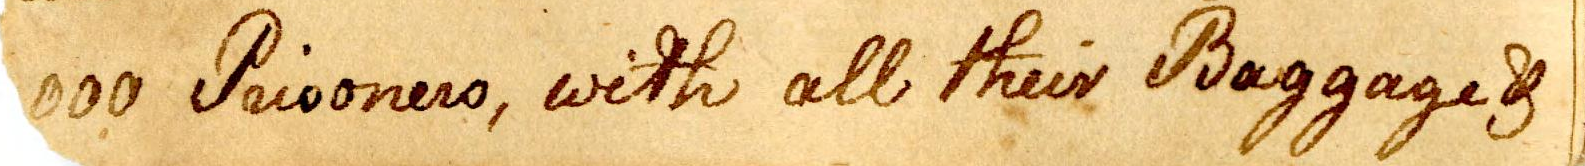000 Prisoners, with all their Baggage &
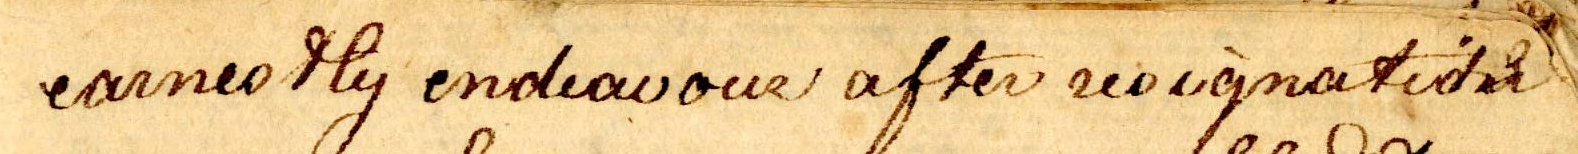earnestly endeavour after resignation
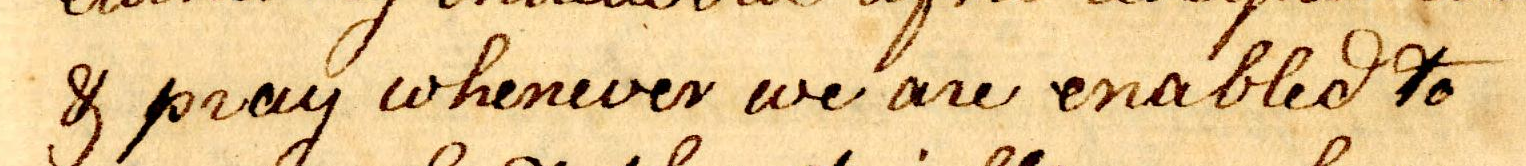& pray whenever we are enabled to
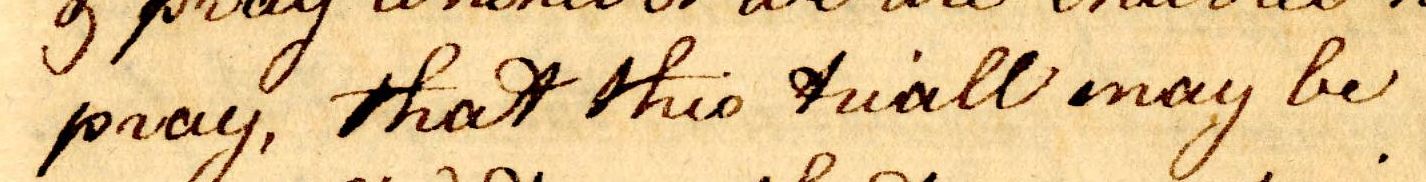pray, that this triall may be
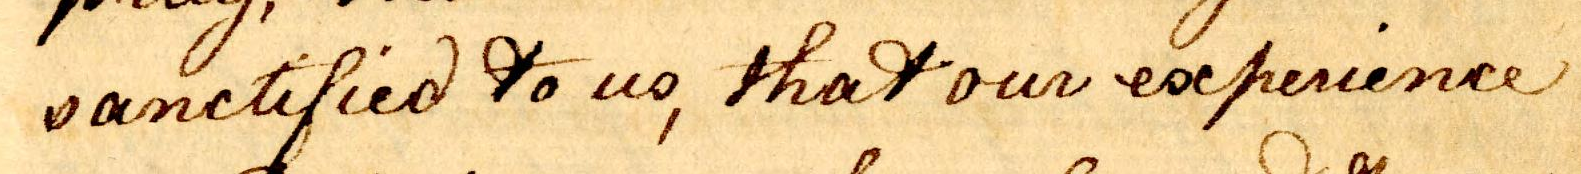sanctified to us, that our experience
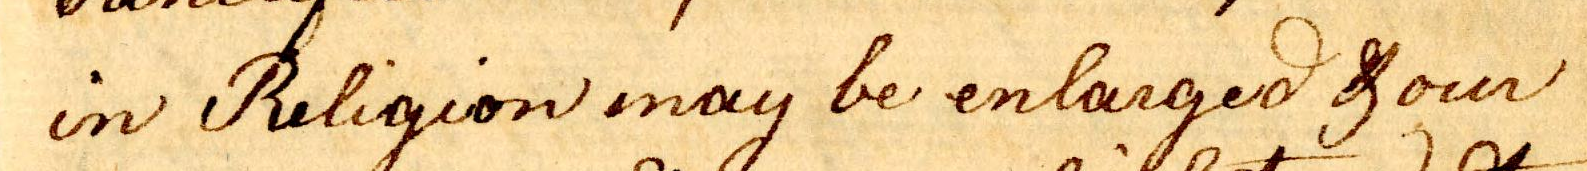in Religion may be enlarged & our
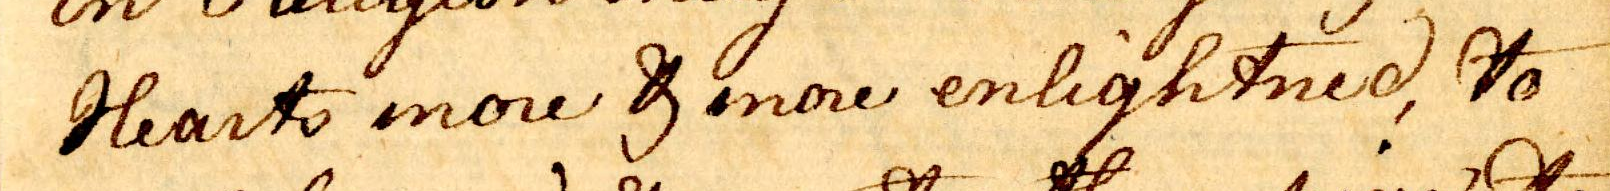Hearts more & more enlightned, to
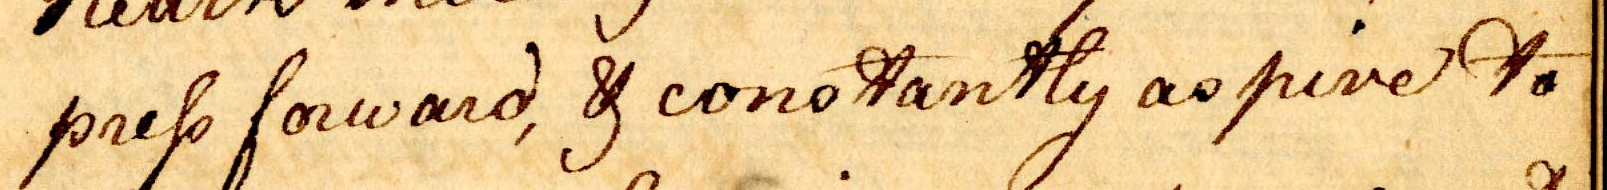press forward, & constantly aspire to
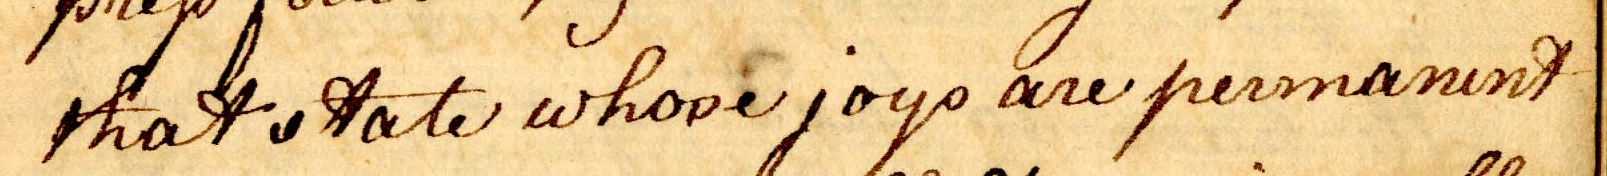that state whose joys are permanent
